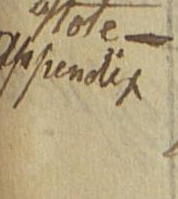Appendix
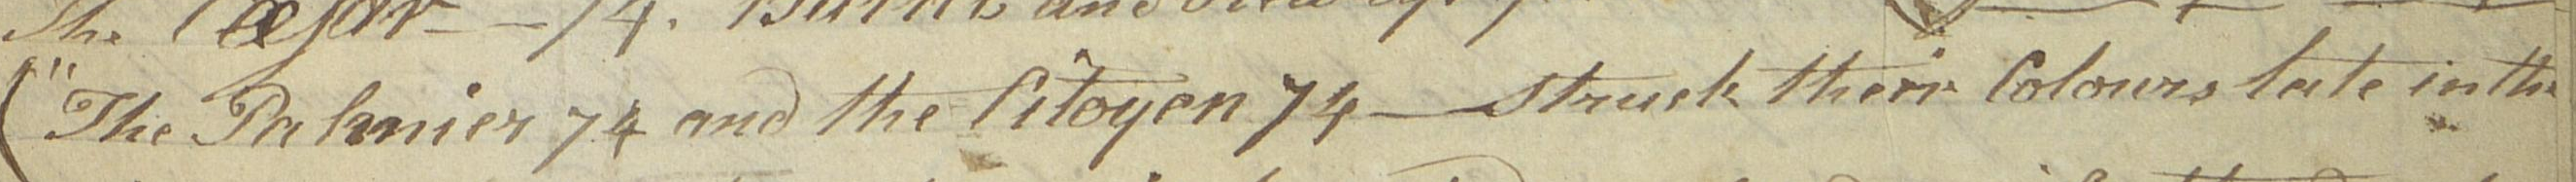(The Palmier 74 and the Citoyen 74, struck their Colours late in the
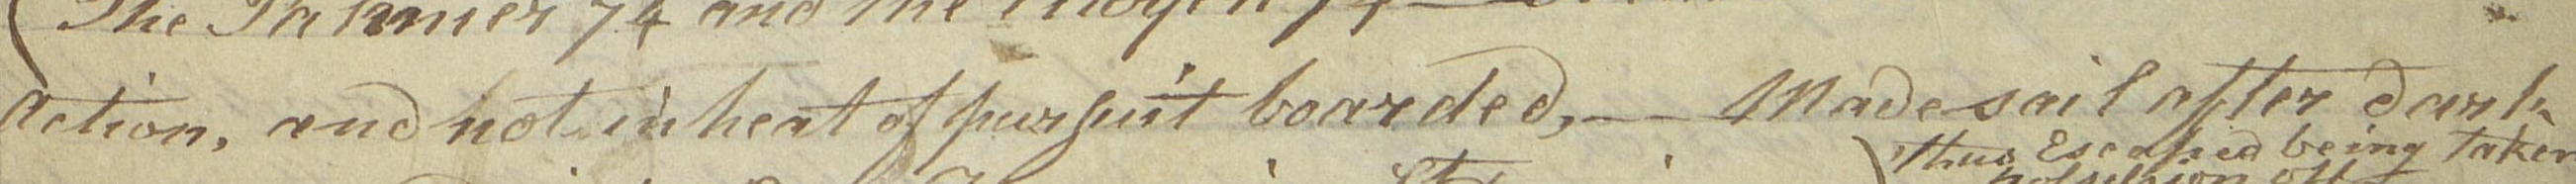action, and not in heat of pursuit boarded, Made sail after dark
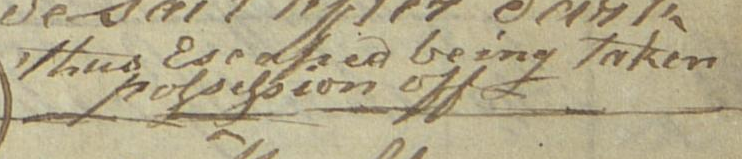thus Escaped being taken
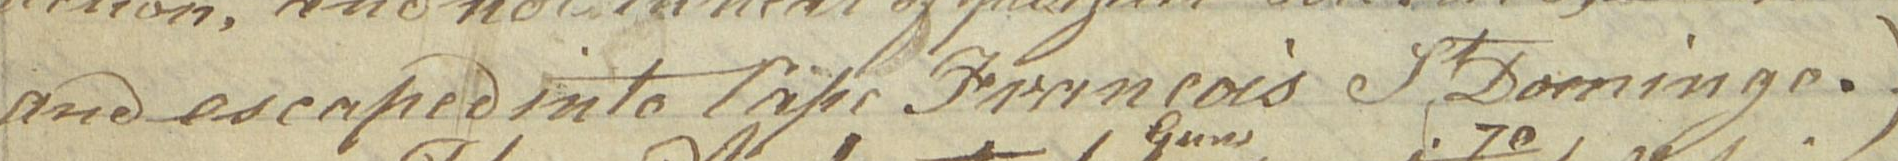and escaped into Capt Francois S^t Domingo.)
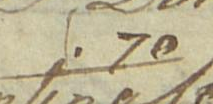p 70
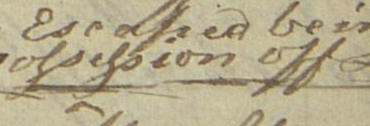possession off
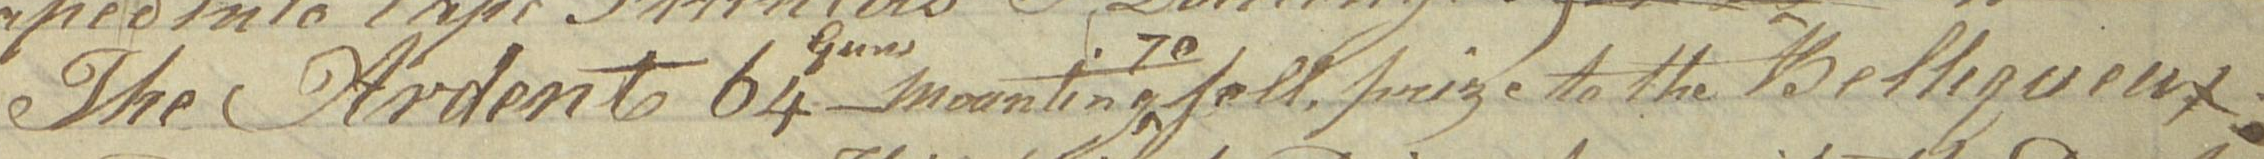The Ardent 64^Guns mounting ^ fall prize to the Belliqueux,
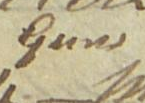Guns
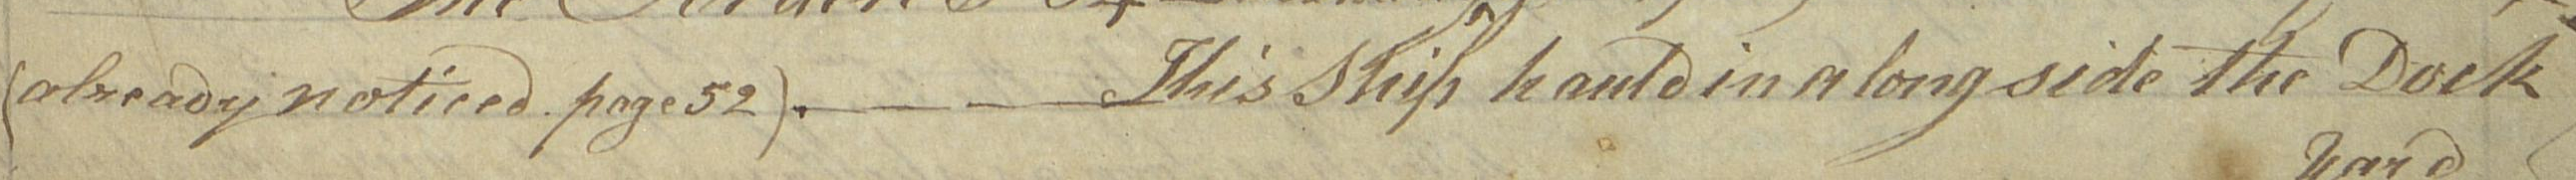(already noticed page 52) This Ship hauld in a long side the Dock
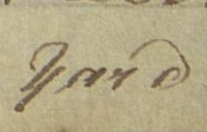Yard
